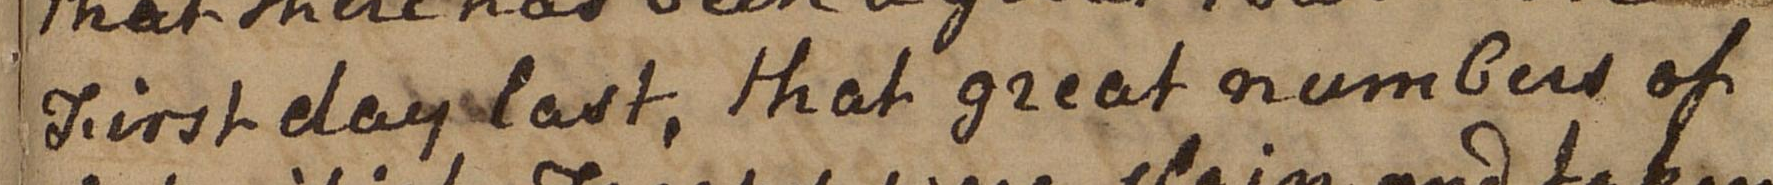First day last, that great numbers of
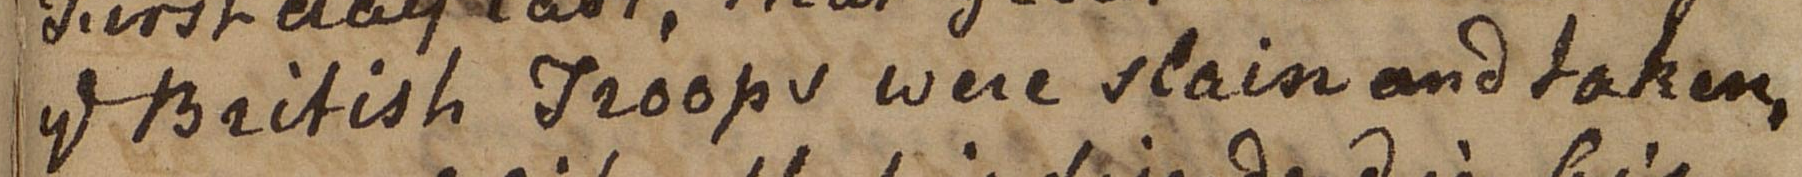y^e British Troops were slain and taken,
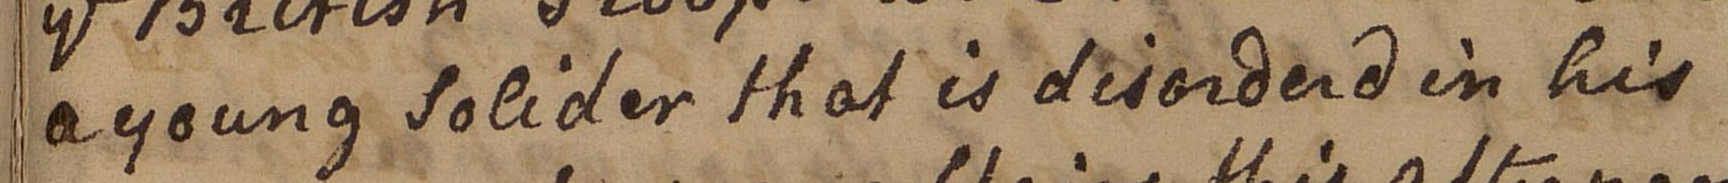a young Solider that is disorderd in his
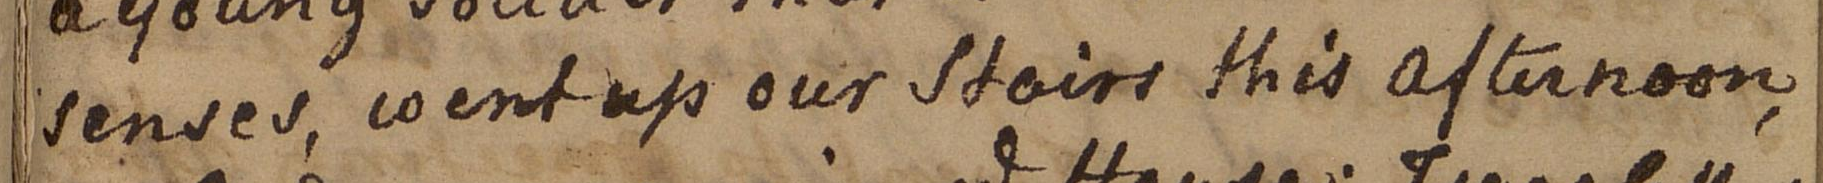senses, went up our Stairs this afternoon,
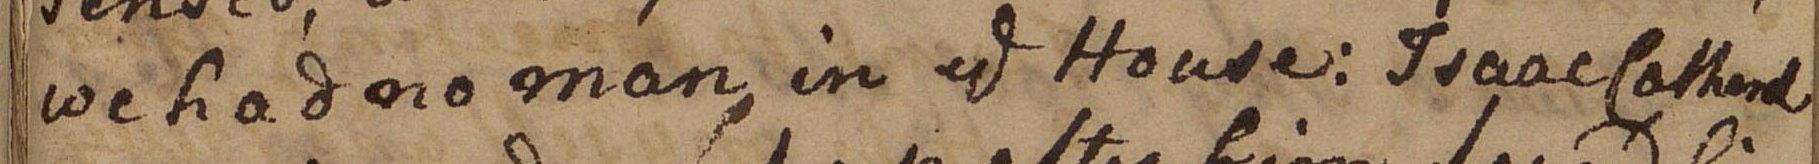we had no man, in y^e House: Isaac Catheral
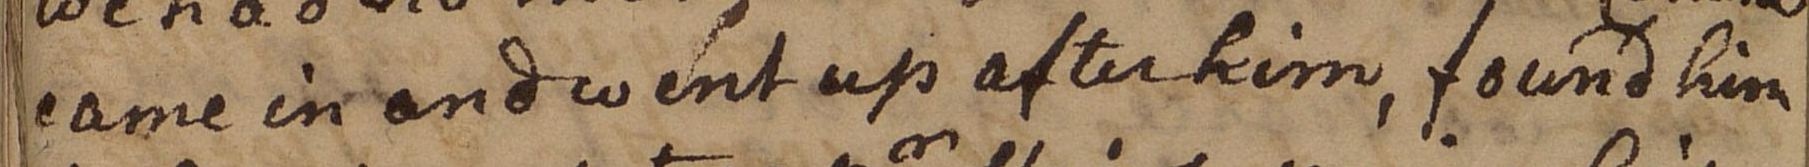came in and went up after him, found him
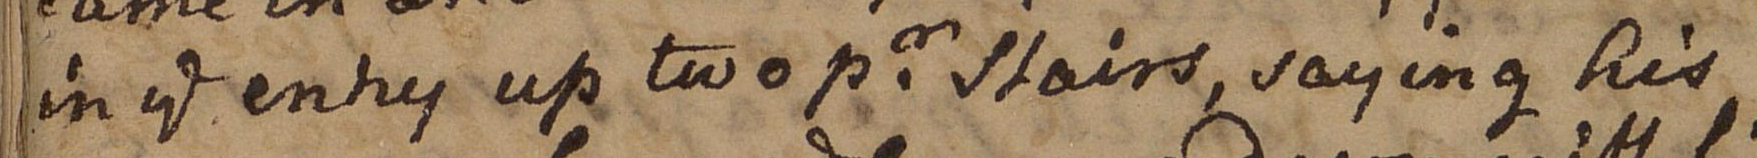in y^e entry up two p^r. Stairs, saying his
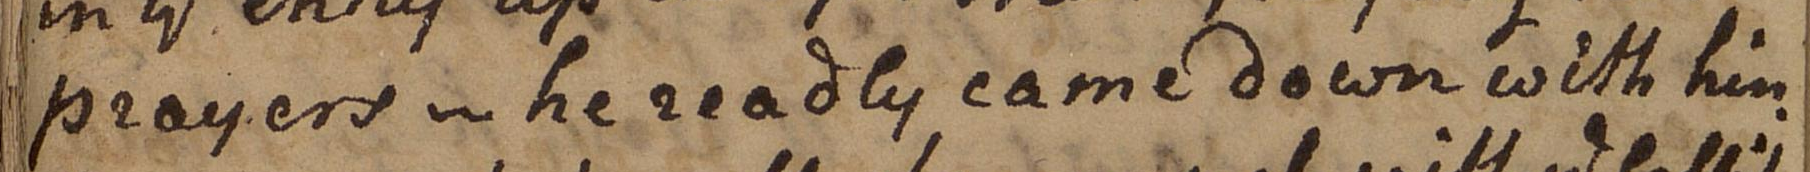prayers- he readly came down with him.
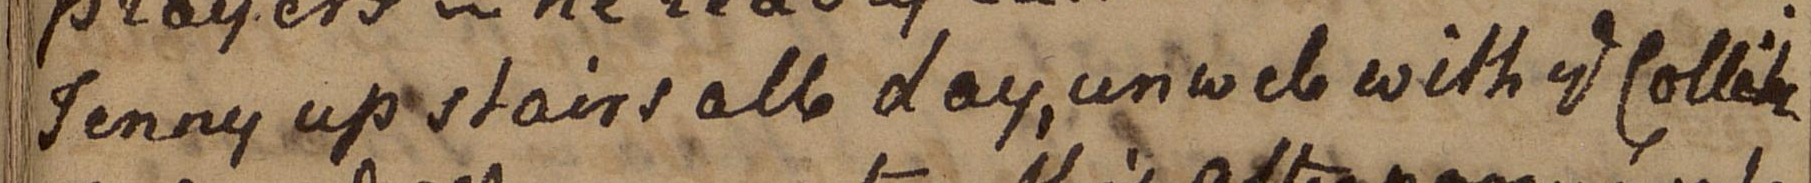Jenny upstairs all day, unwel with y^e Collik
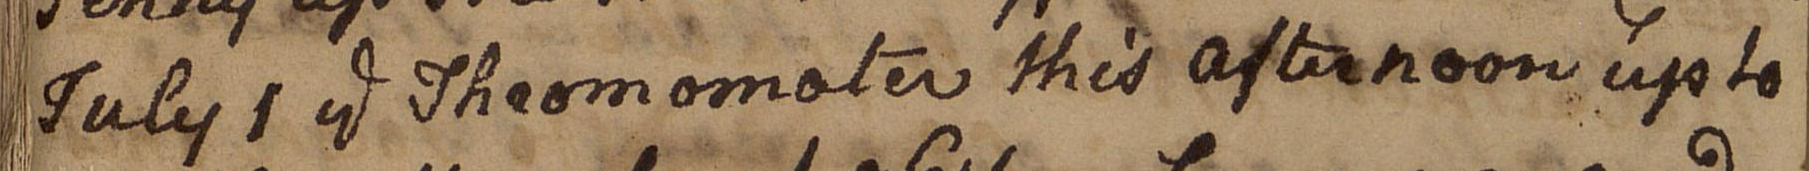July 1 y^e Thromomater this afternoon up to
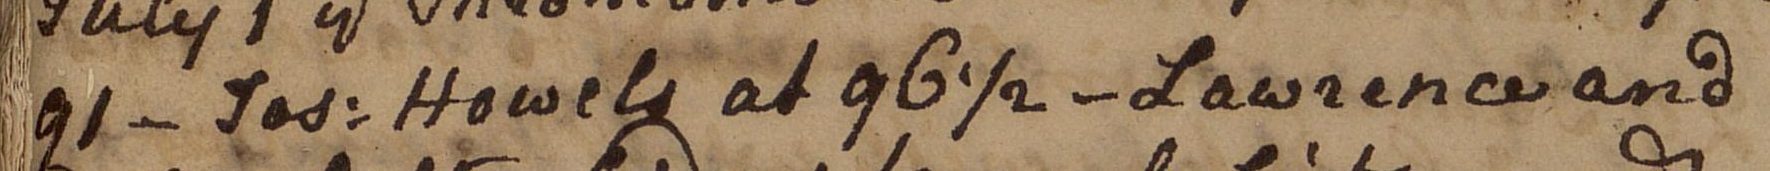91- Jos: Howels at 96 1/2- Lawrence and
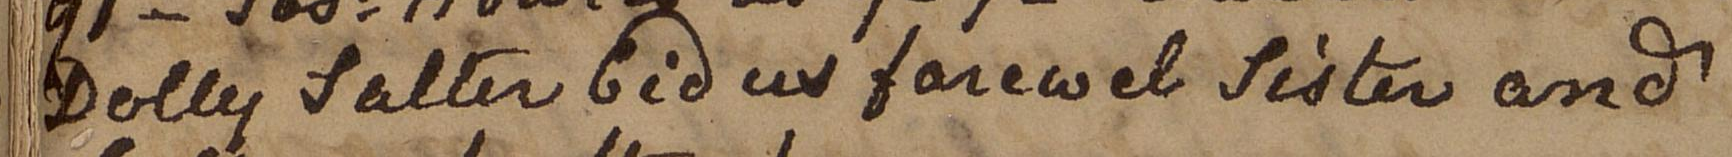Dolly Salter bid us farewel Sister and
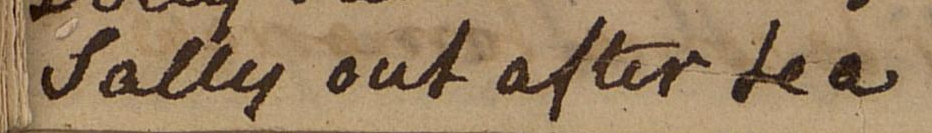Sally out after tea
